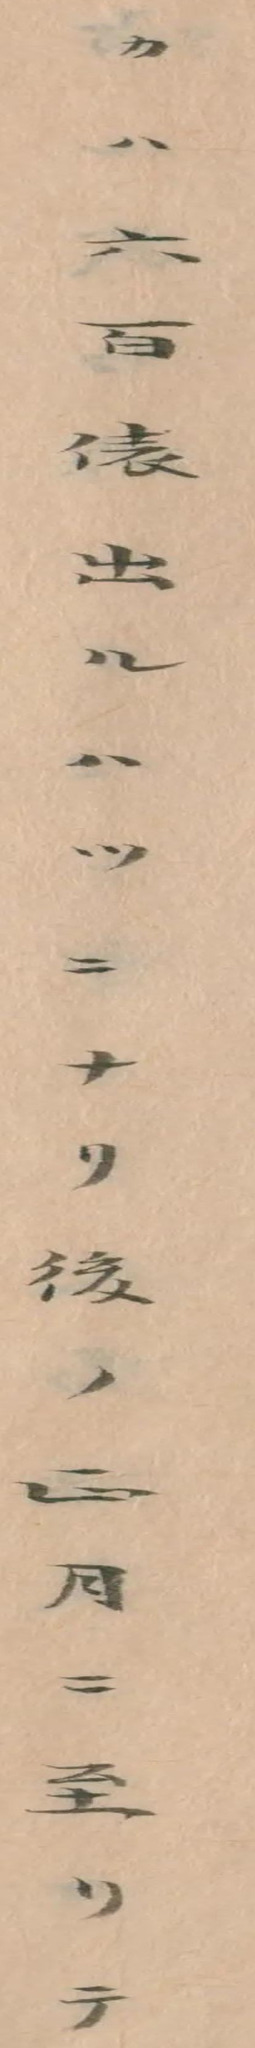カハ六百俵出ㇽハツ二ナリ後ノ正月二至りテ

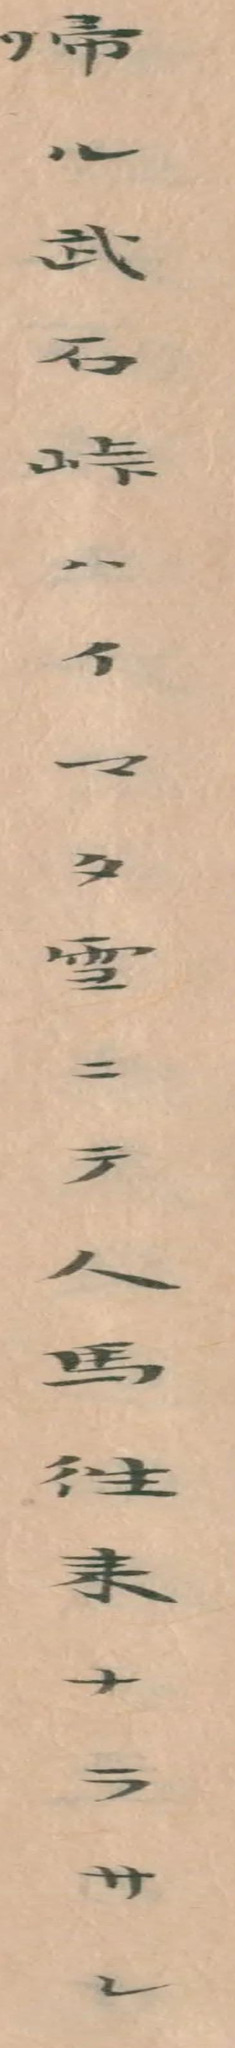帰ㇽ武石峠ハイマタ雪ニテ人馬往来ナラサレ
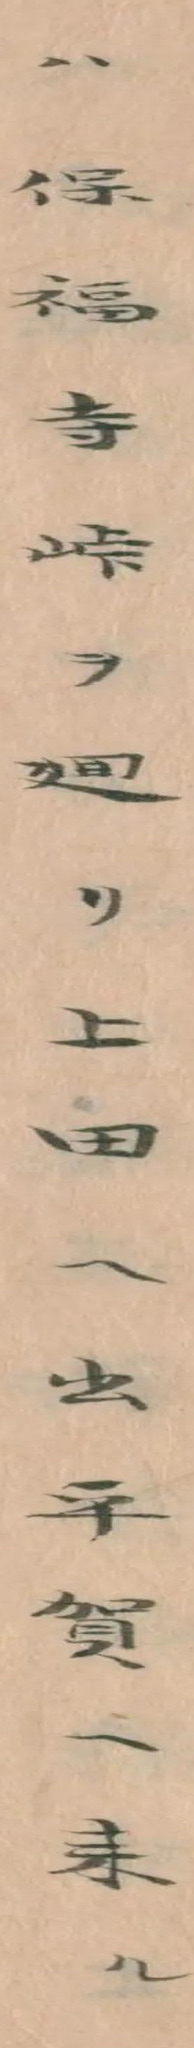ハ保福寺峠ヲ廻り上田へ出平賀へ来ル
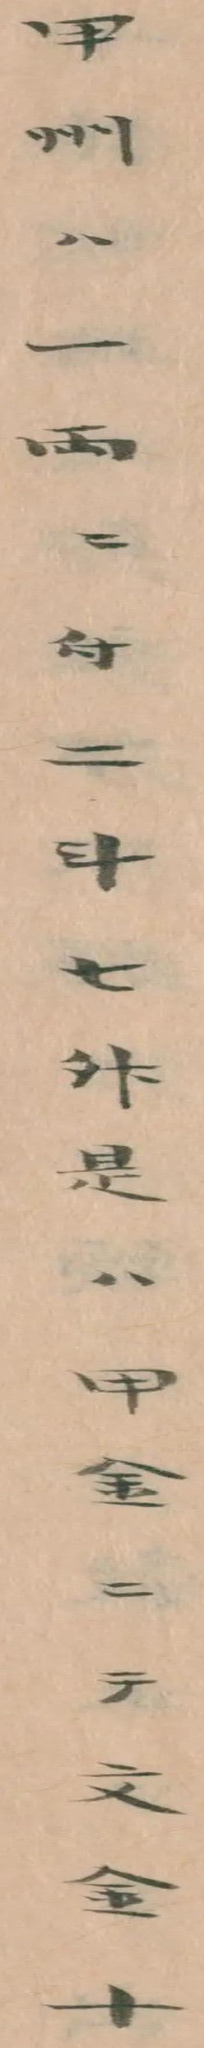甲州ハ一両二付二斗七升是ハ甲金ニテ文金十
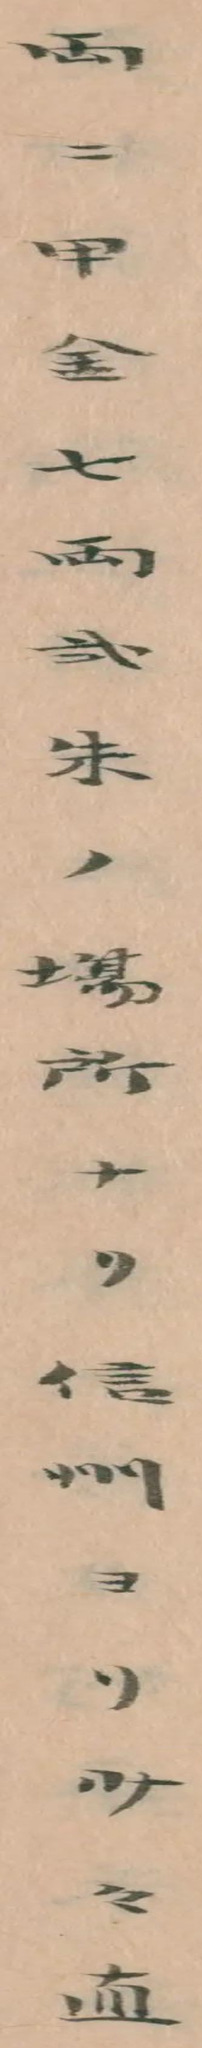両二甲金七両弐朱ノ場所ナリ信州ヨリ少々直
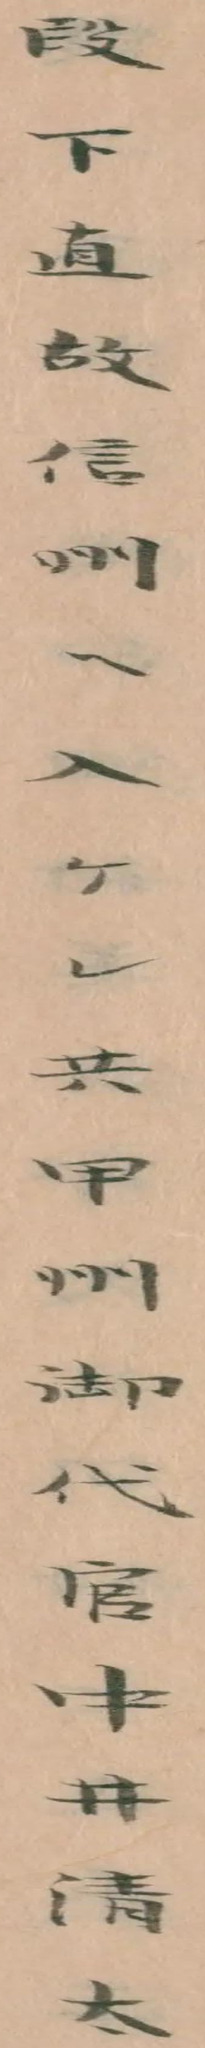段下直故信州へ入ケレ共甲州御代官中井清太
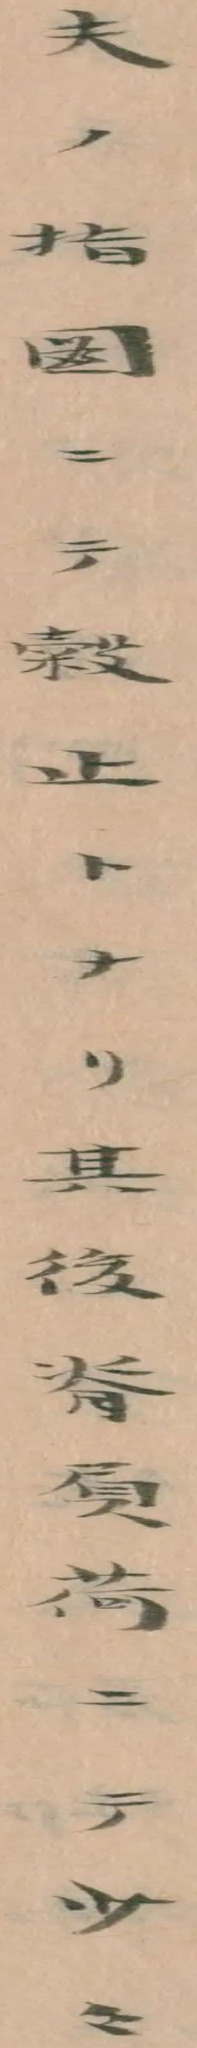夫ノ指図ニテ穀止トナリ其後背負荷ニテ少々
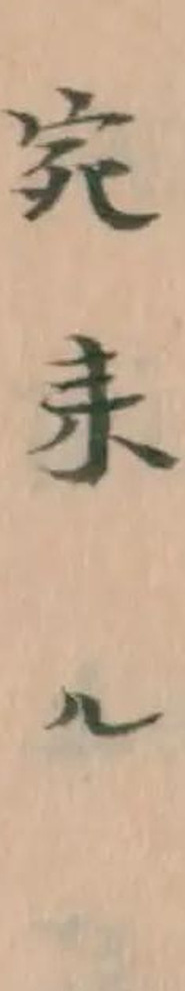宛来ル
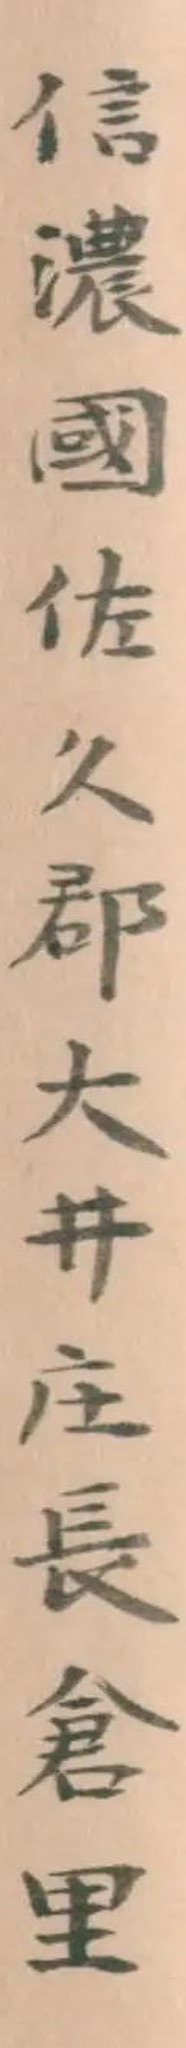信濃国佐久郡大井庄長倉里
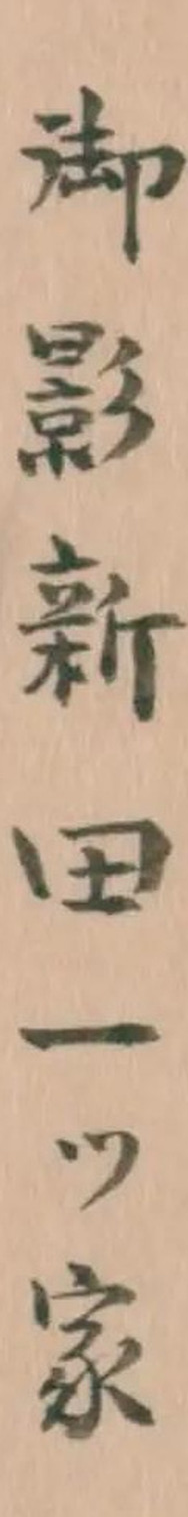御影新田一ツ家
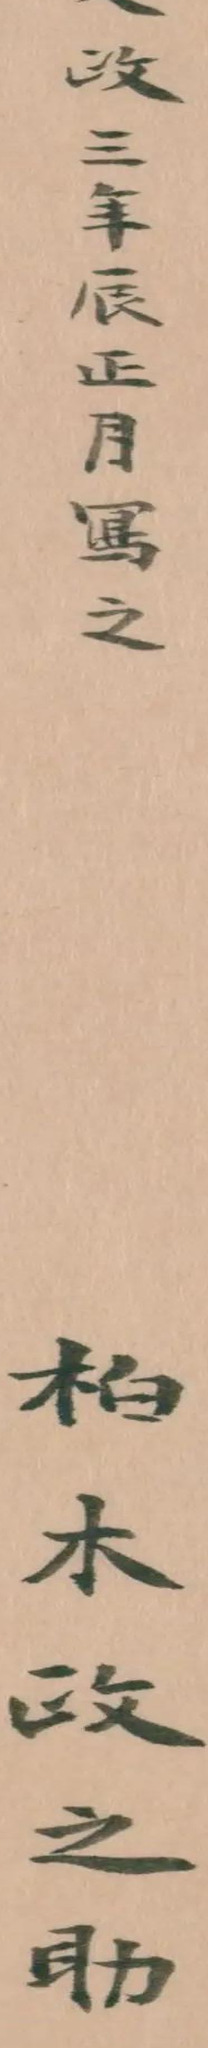文政三年辰正月写之柏木政之助
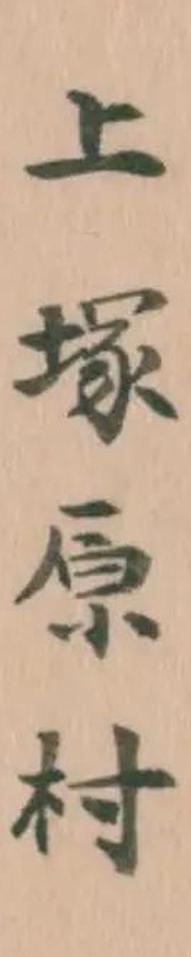上塚原村
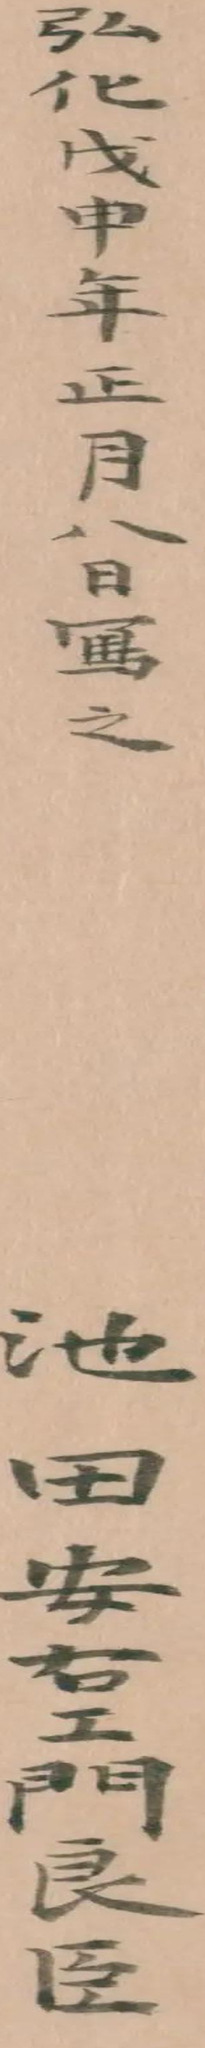弘化戊申年正月八日写之池田安右衛門良臣
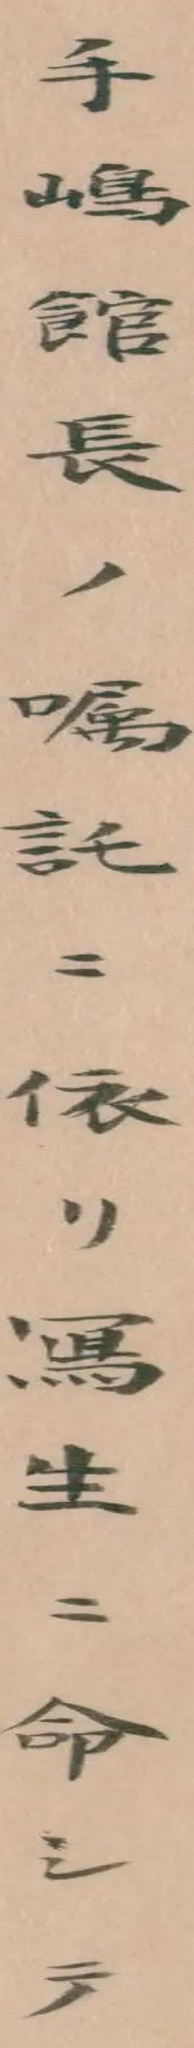手嶋館長ノ嘱託二依り写生二命シテ
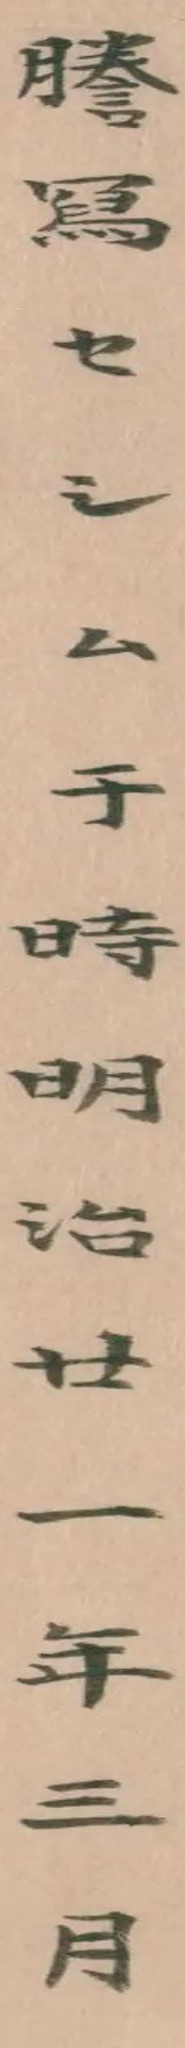謄写セシム干時明治廿一年三月
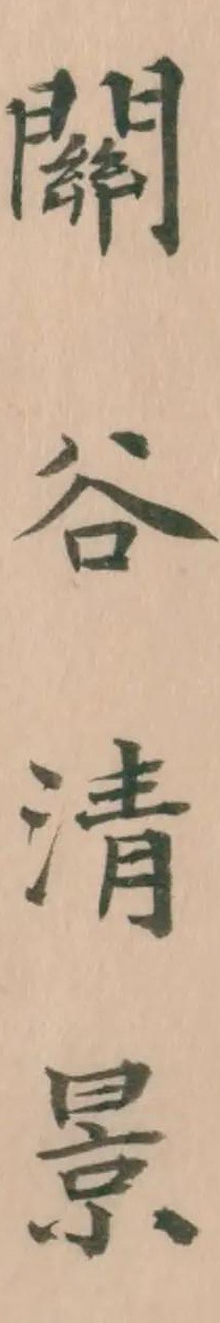関谷清景
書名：地災撮要. 巻3(地震之部)-巻4(噴火之部)
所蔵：国立国会図書館 National Diet Library, JAPAN
